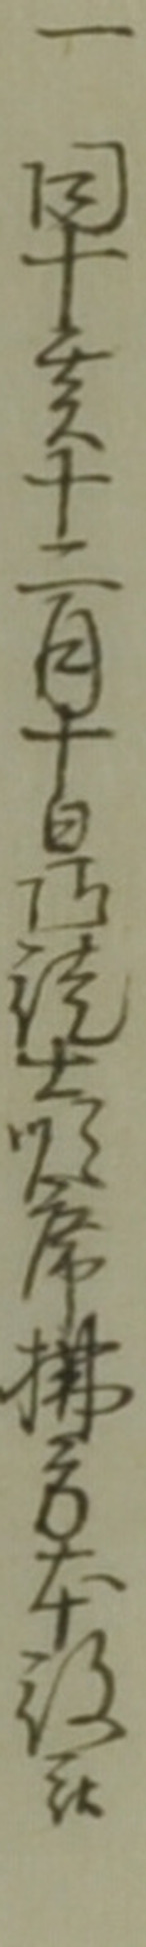一同十亥十二月十日御徒士順席払方本役被
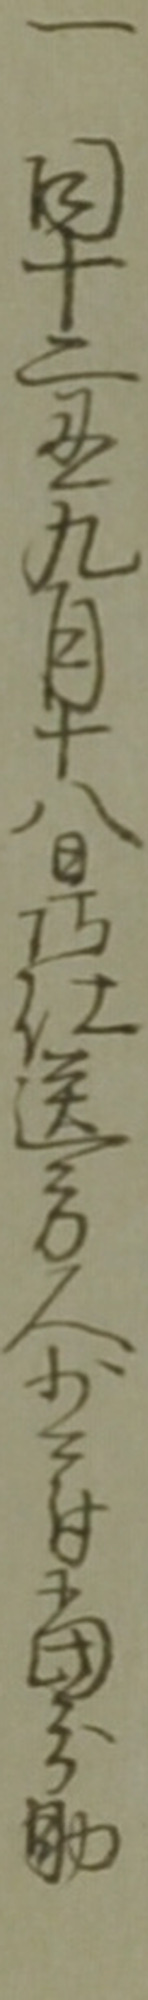一同十二丑九月十八日御仕送方人少ニ付当分助
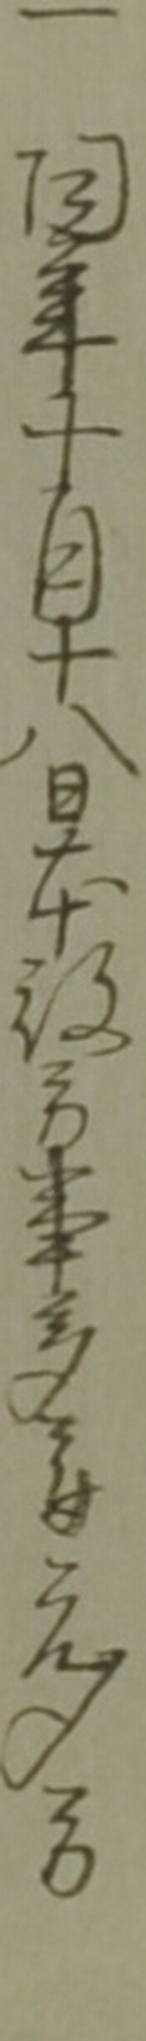一同年十月十八日本役方事多ニ付元〆方
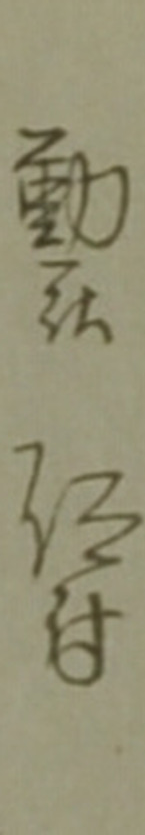勤被仰付
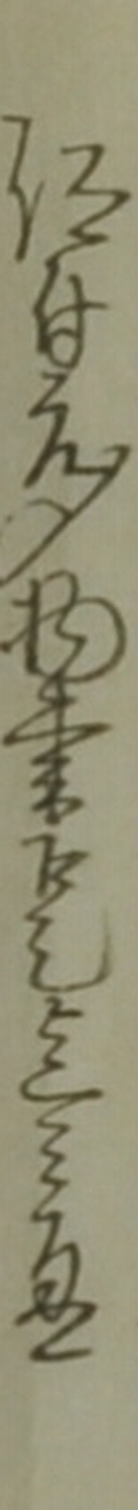仰付元〆物書是迄之通
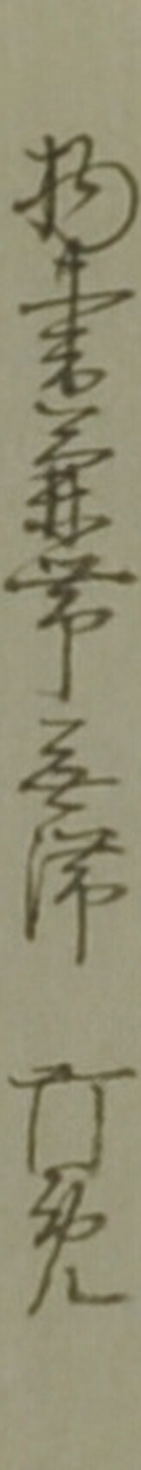物書兼帯無滞御免
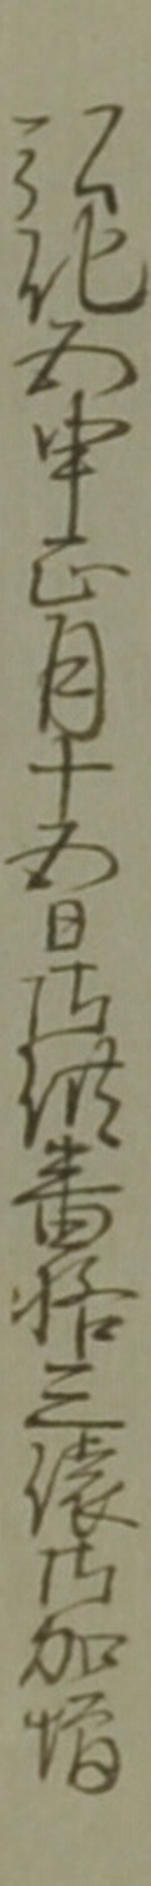一弘化五申正月十五日御徒士番格三俵御加増

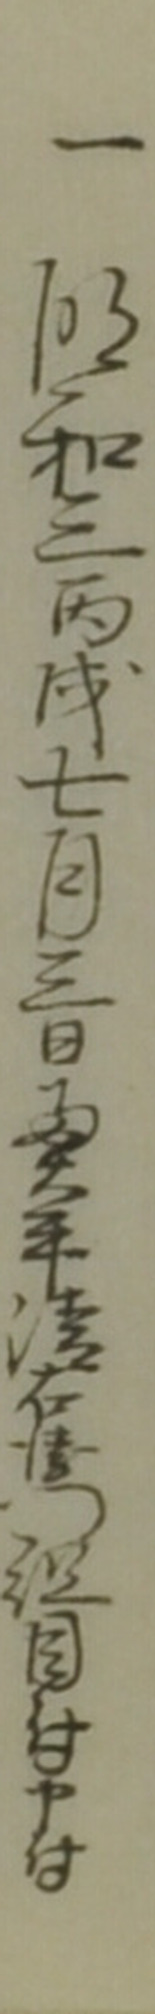一明和三丙戌七月三日奥平清右衛門組目付申付
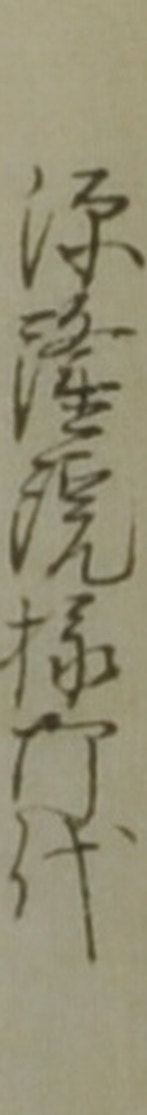源隆院様御代
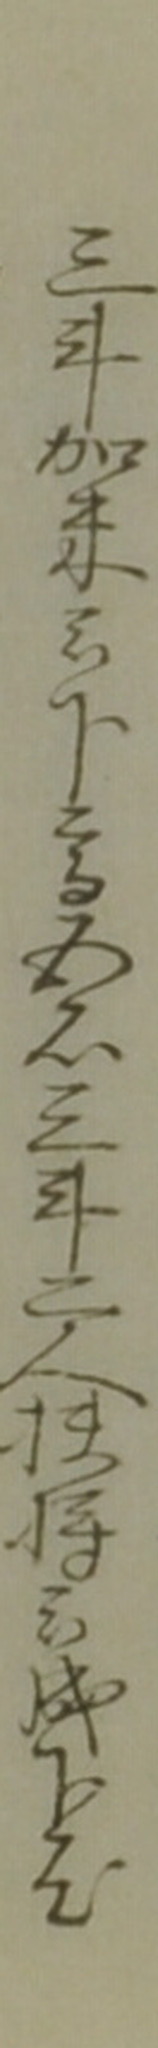三斗加米被下高五石三斗二人扶持被成下尤
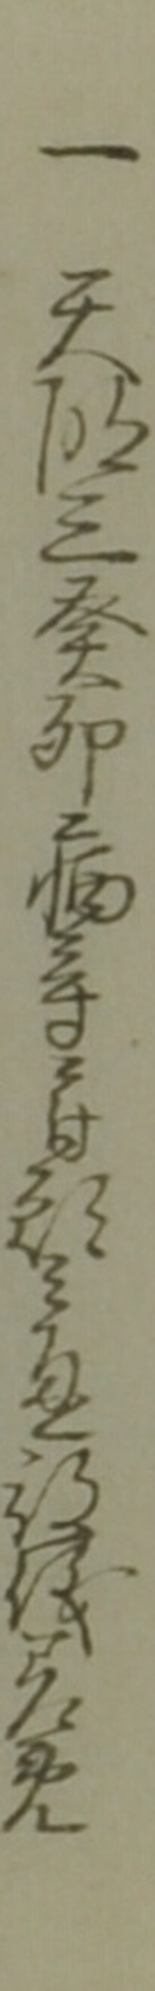一天明三癸卯病気ニ付願之通役儀差免
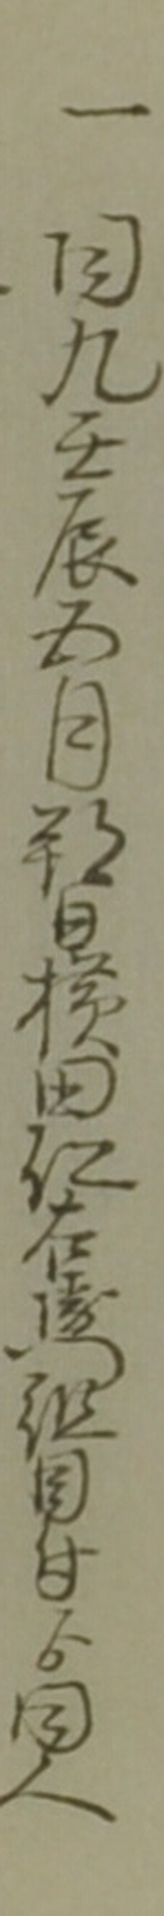一同九壬辰五月朔日横田仁右衛門組目付ゟ同人
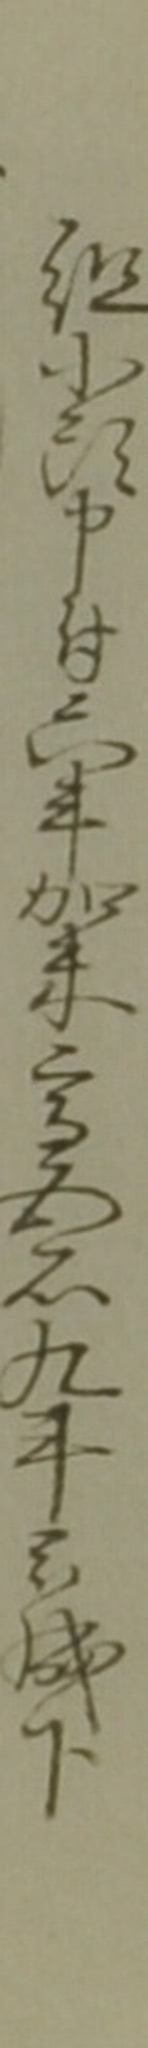組小頭申付六斗加米高五石九斗被成下
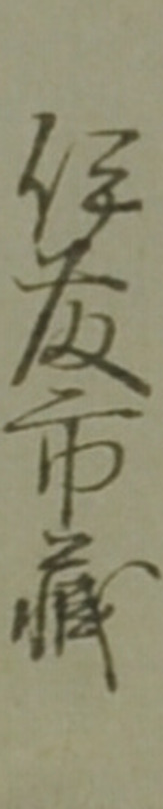伊藤市蔵
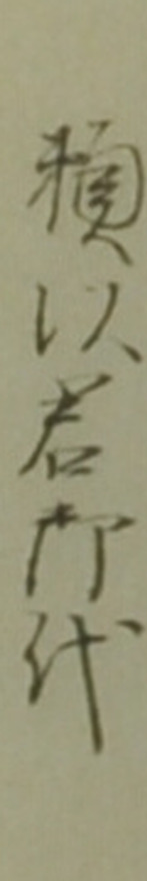頼以君御代

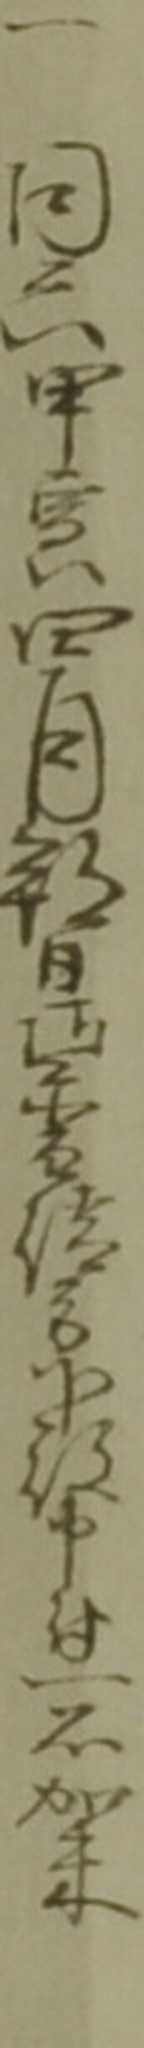一同六甲寅四月朔日御普請方下役申付一石加米
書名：無足諸士勤仕録（七）
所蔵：伊那市立高遠町図書館・合同会社AMANE
